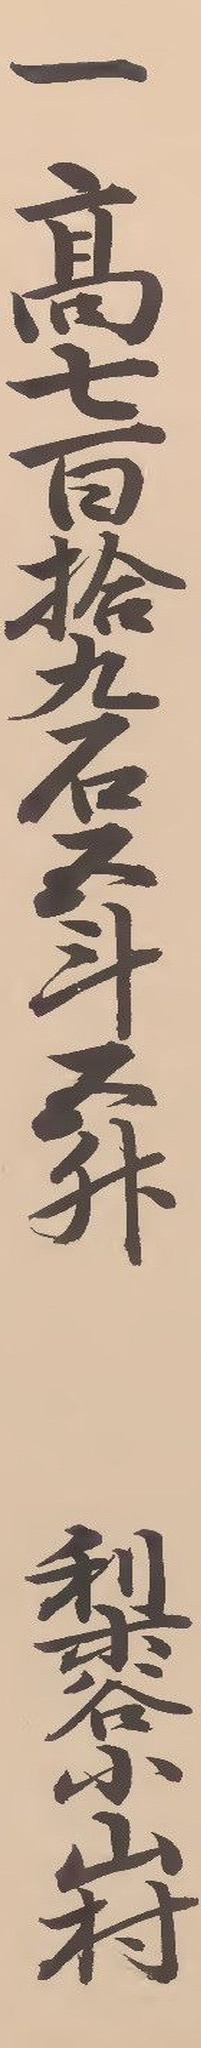一高七百拾九石五斗五升梨谷小山村
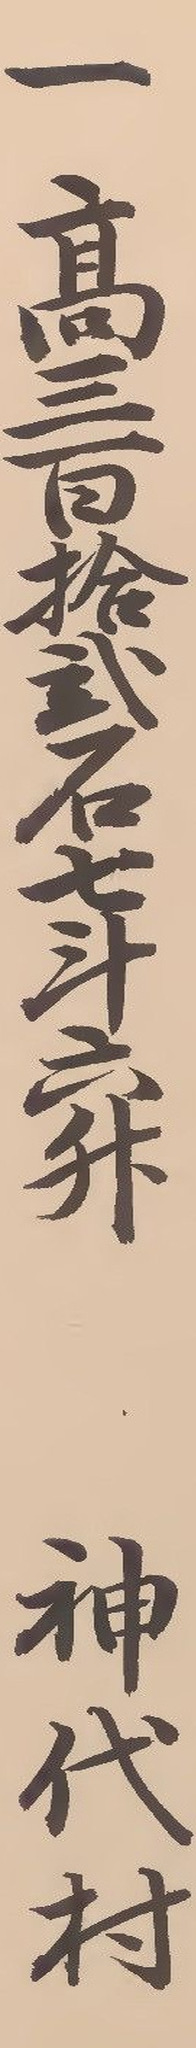一高三百拾弐石七斗六升神代村
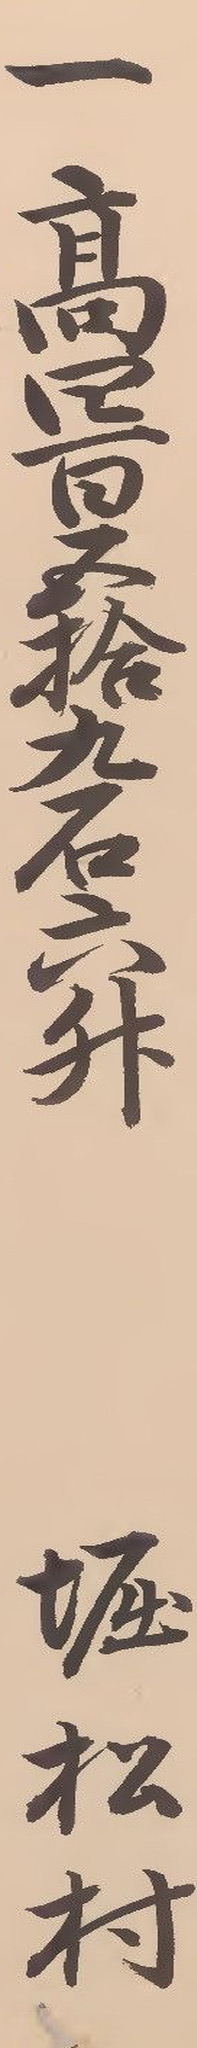一高四百五拾九石六升堀松村
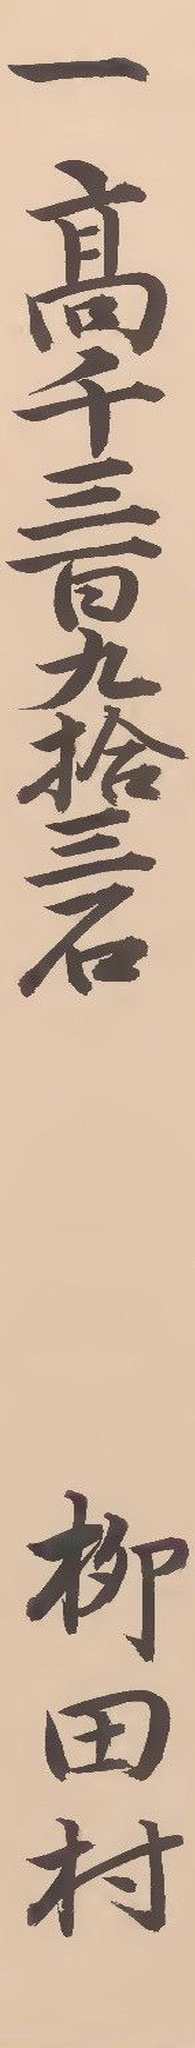一高千三百九拾三石柳田村

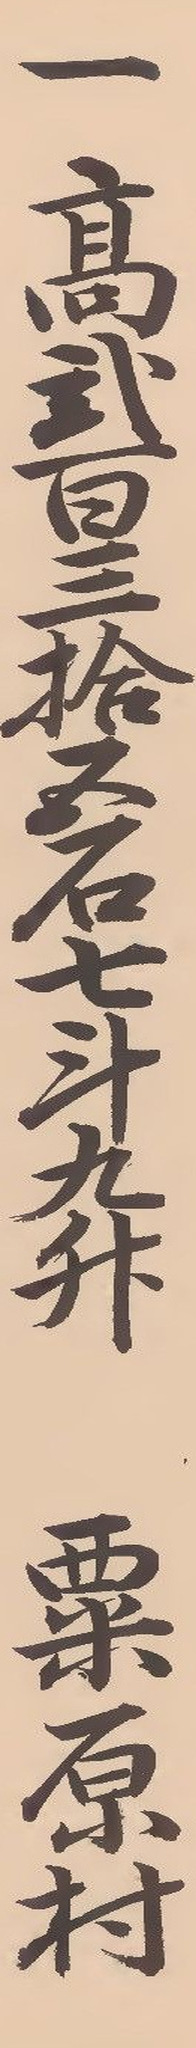一高弐百三拾五石七斗九升粟原村
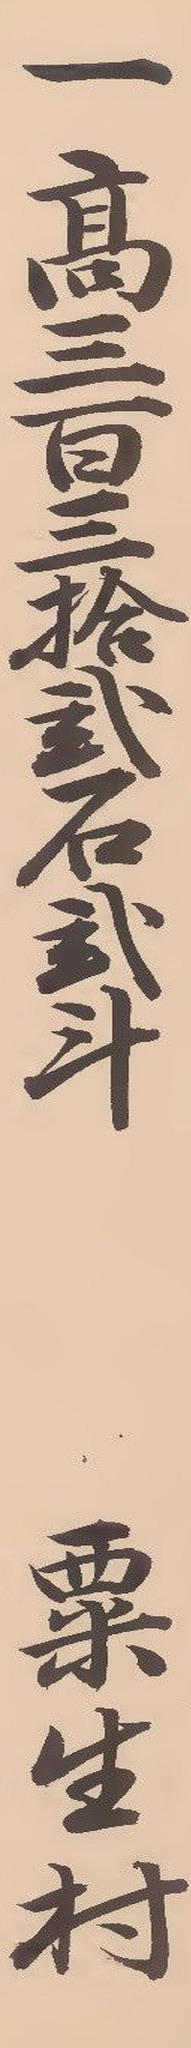一高三百三拾弐石弐斗粟生村
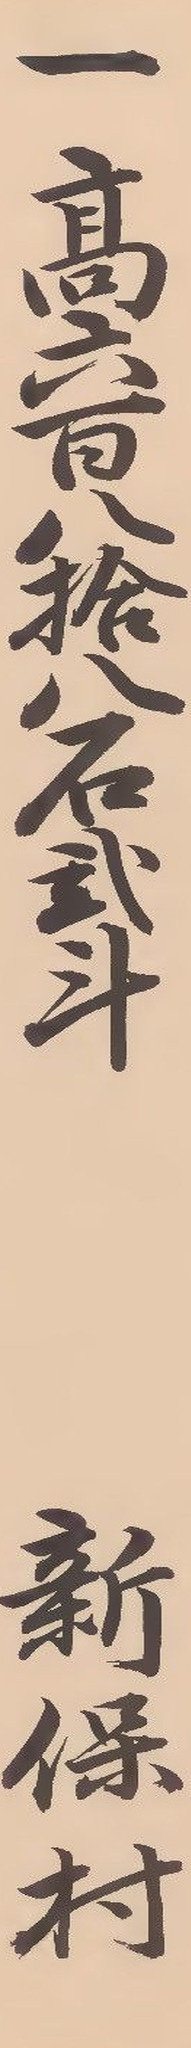一高六百八拾八石弐斗新保村
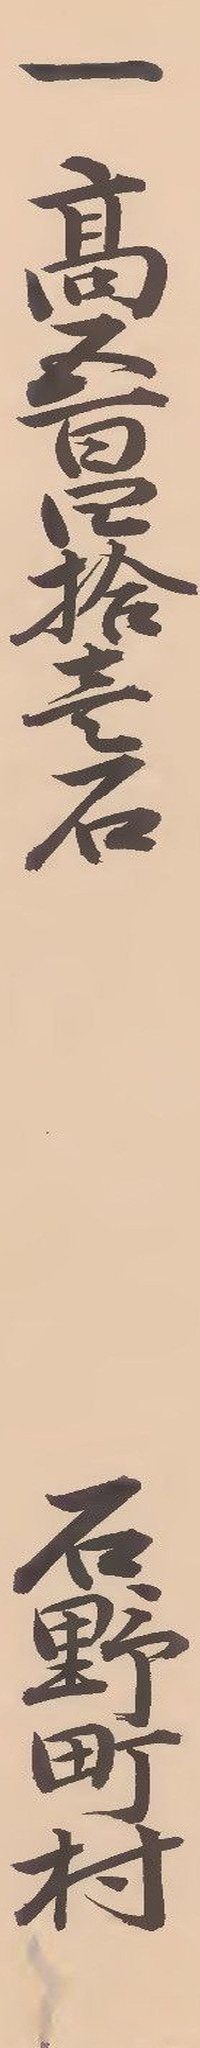一高五百四拾壱石石野町村

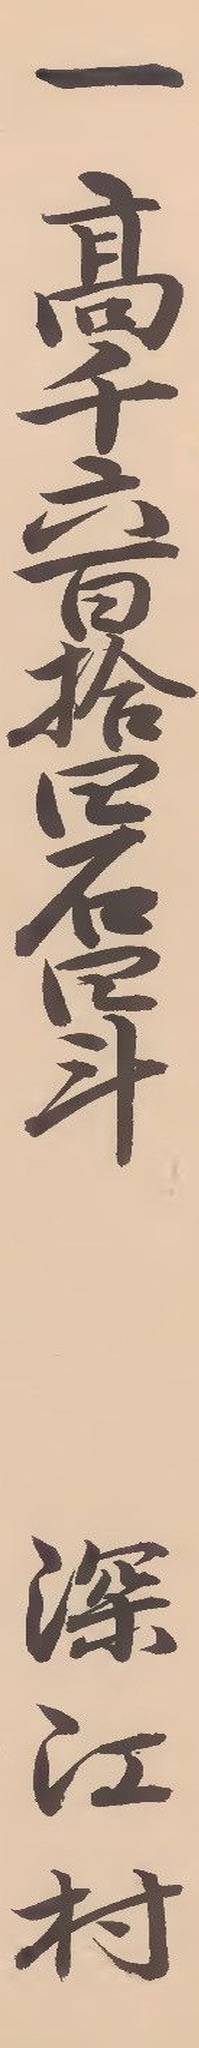一高千六百拾四石四斗深江村
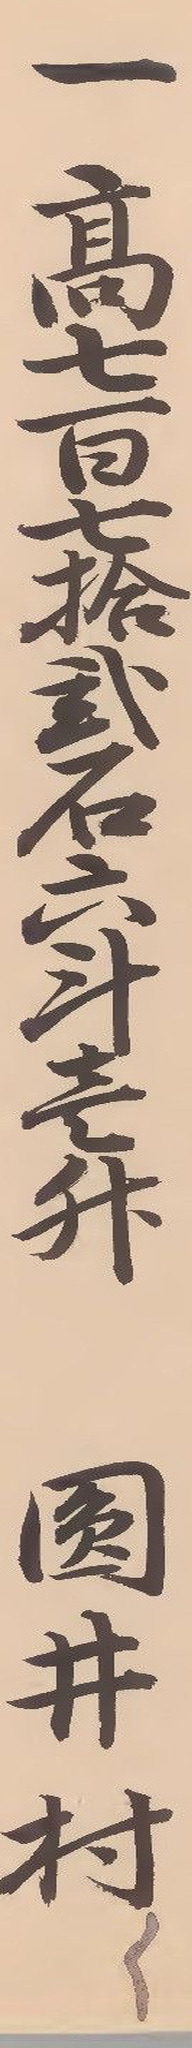一高七百七拾弐石六斗壱升円井村
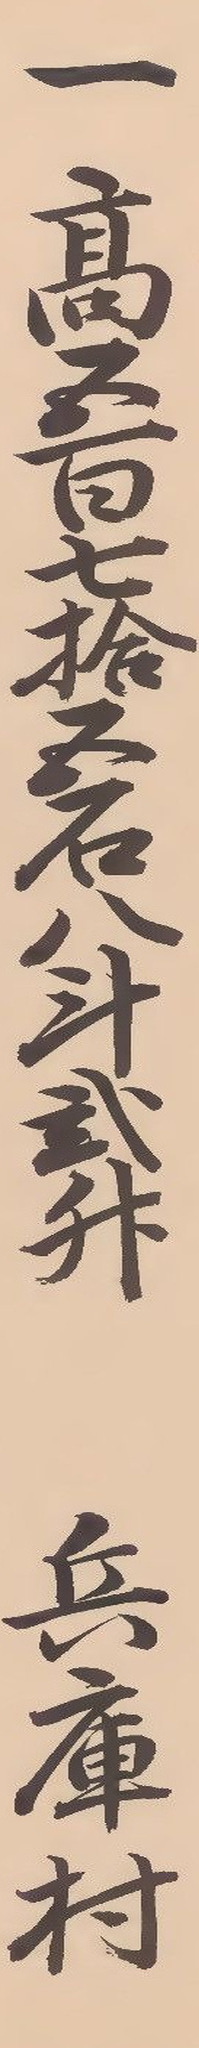一高五百七拾五石八斗弐升兵庫村
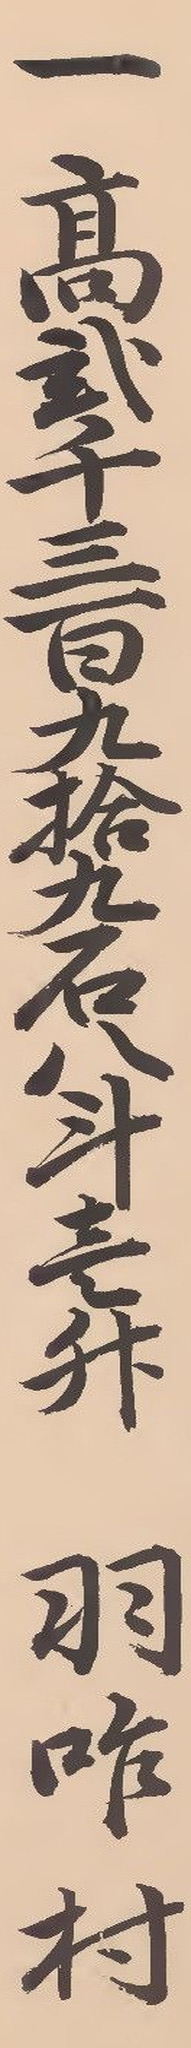一高弐千三百九拾九石八斗壱升羽咋村
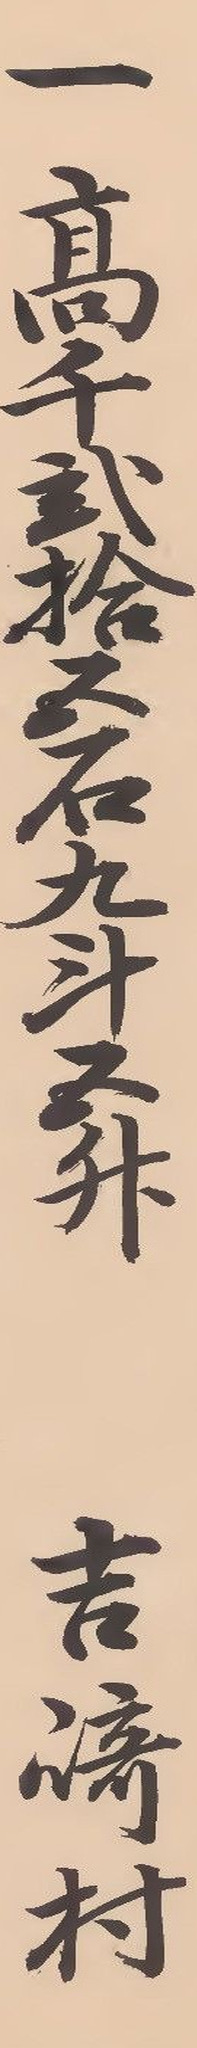一高千弐拾五石九斗五升吉崎村
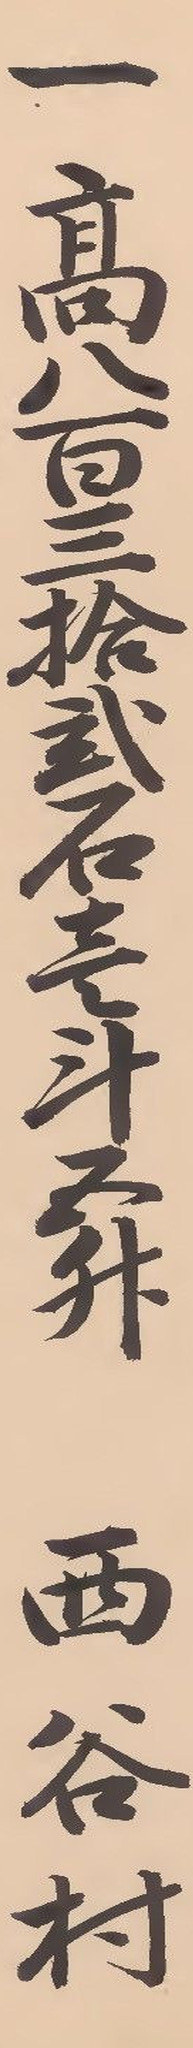一高八百三拾弐石壱斗五升西谷村

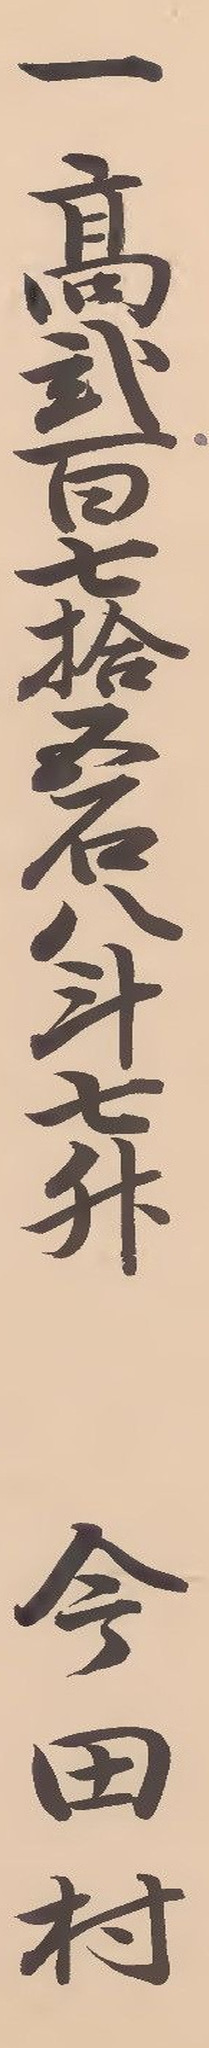一高弐百七拾五石八斗七升今田村
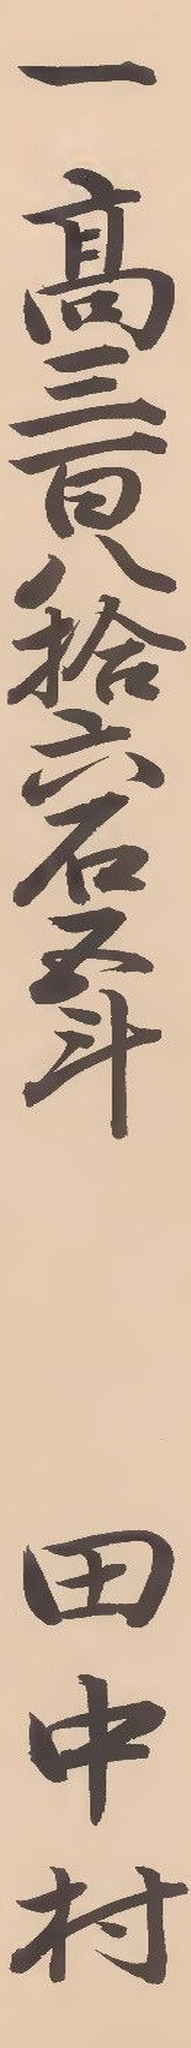一高三百八拾六石五斗田中村
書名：能登国郷帳
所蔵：国立公文書館 National Archives of Japan
